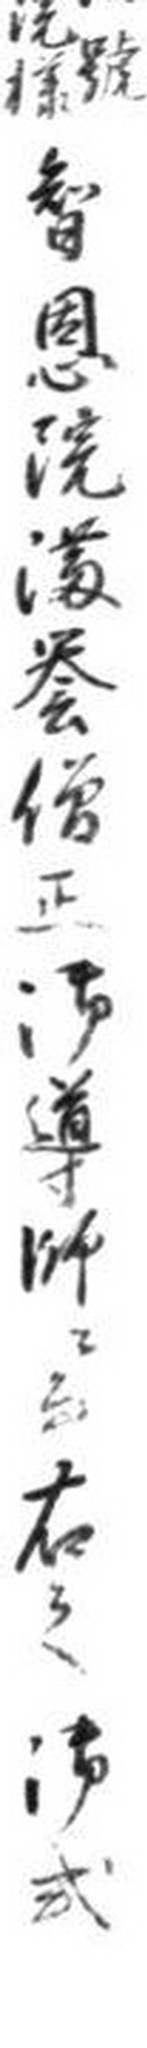浄光院様智恩院満誉僧正御導師ニ而右之御式
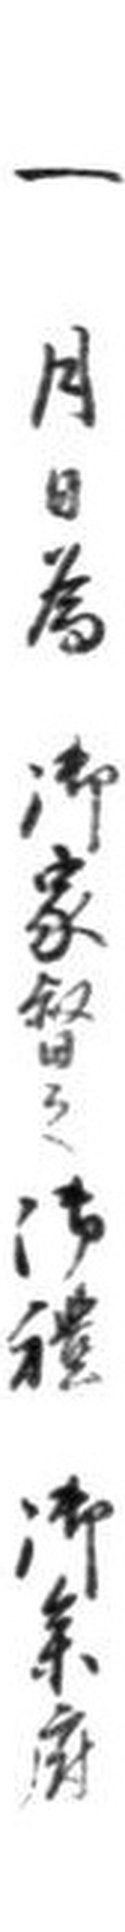一月日為御家督之御礼御参府
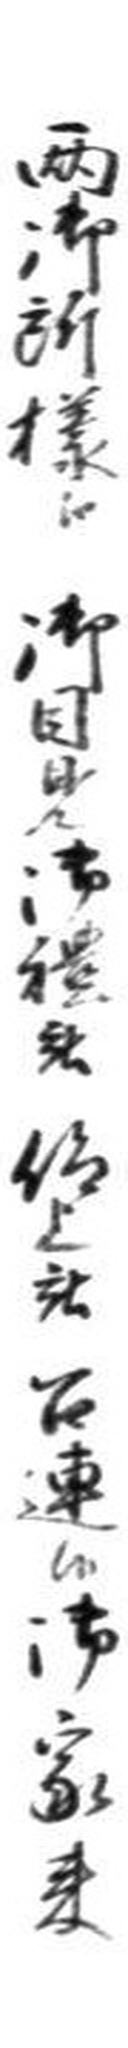両御所様江御目見御礼被仰上被召連候御家来
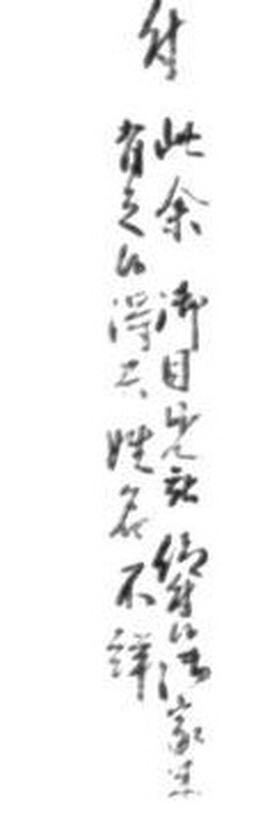有之候得共姓名不詳
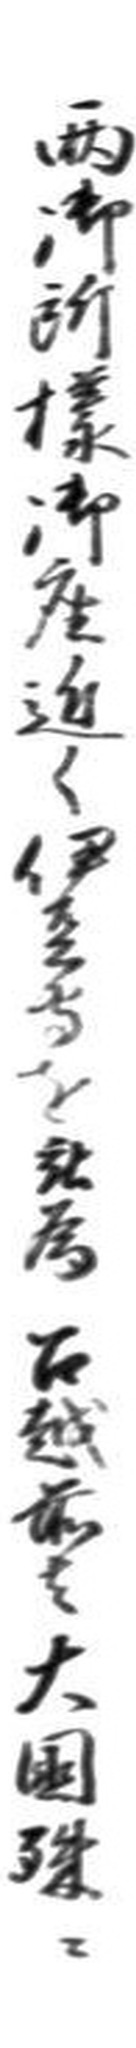両御所様御座近く伊豆守を被為召越前者大国殊ニ
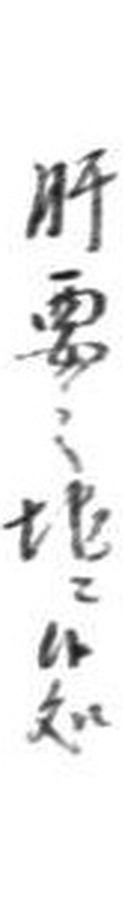肝要之地ニ候処
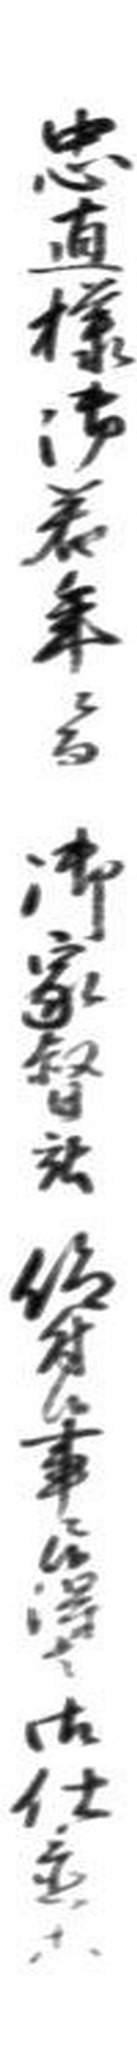忠直様御若年ニ而御家督被仰付候事ニ候得者御仕置等
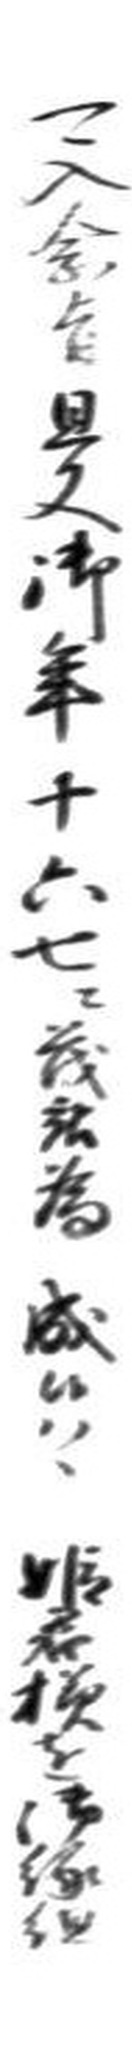可入念旨且又御年十六七ニ茂被為成候ハヽ姫君様を御縁組
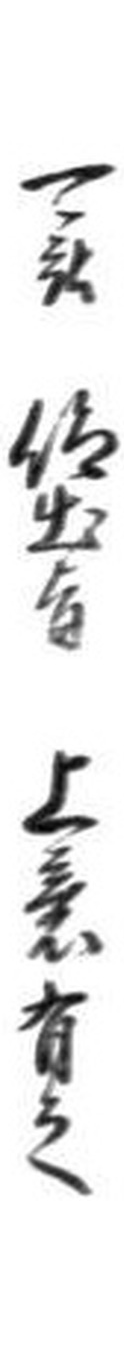可被仰出旨上意有之
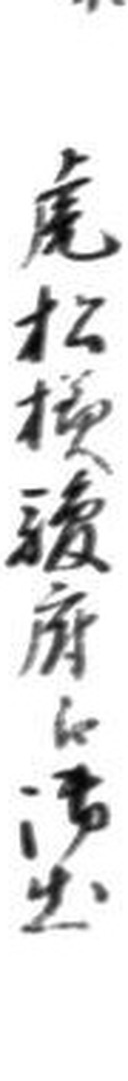詳虎松様駿府江御出
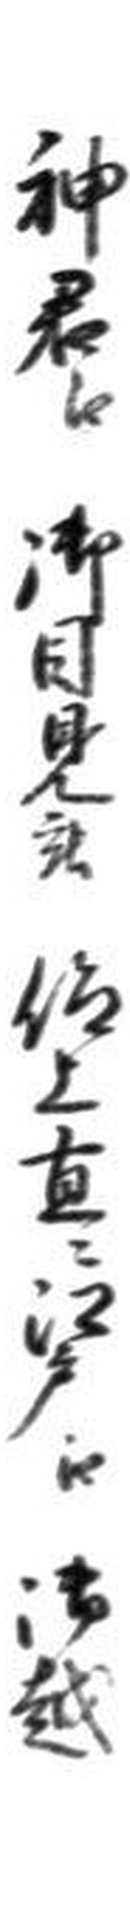神君江御目見被仰上直ニ江戸江御越

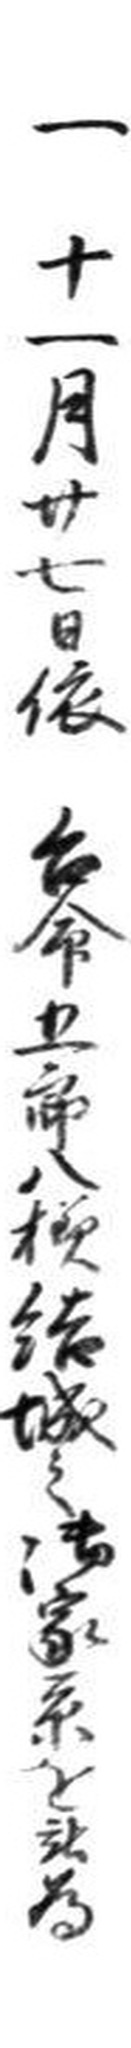一十一月廿七日依台命五郎八様結城之御家系を被為
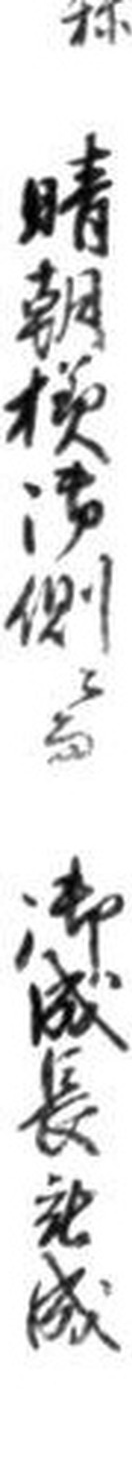松平晴朝様御側ニ而御成長被成
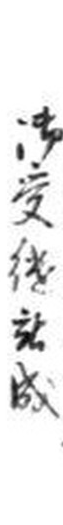御受継被成
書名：家譜 二 忠直公 従文禄四年到慶安四年
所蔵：福井県文書館 Fukui Prefectural Archives
